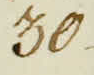30
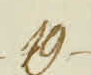19
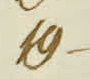19
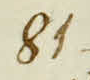81
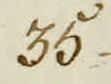35
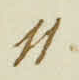11
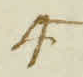4
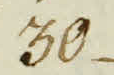30
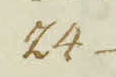24
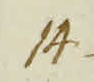14
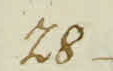28
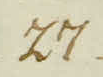27
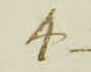4
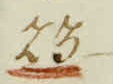23
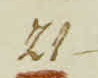21
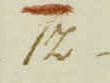12
